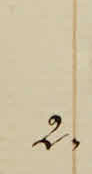2
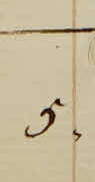5
